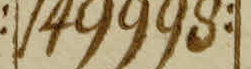149998
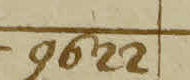9622
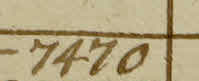7470
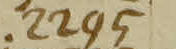2295
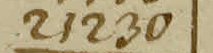21230
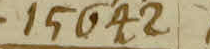15642
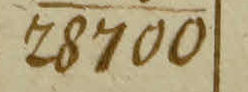28700
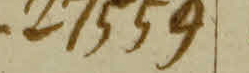27559
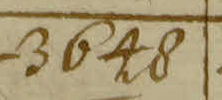3648
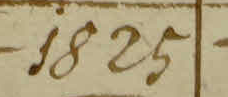1825
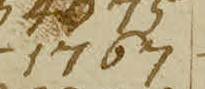1767
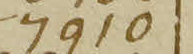7910
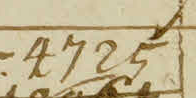4725
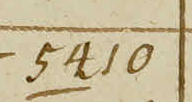5410
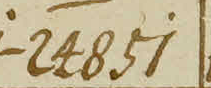24851
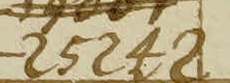25242
